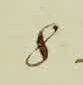8
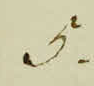5
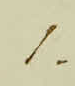1
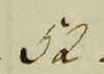52
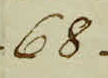68
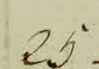25
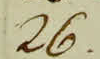26
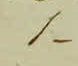1
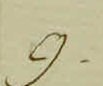9
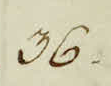36
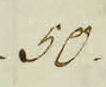50
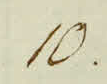10
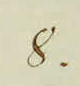8
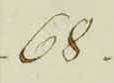68
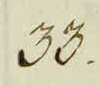33
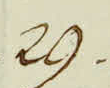29
